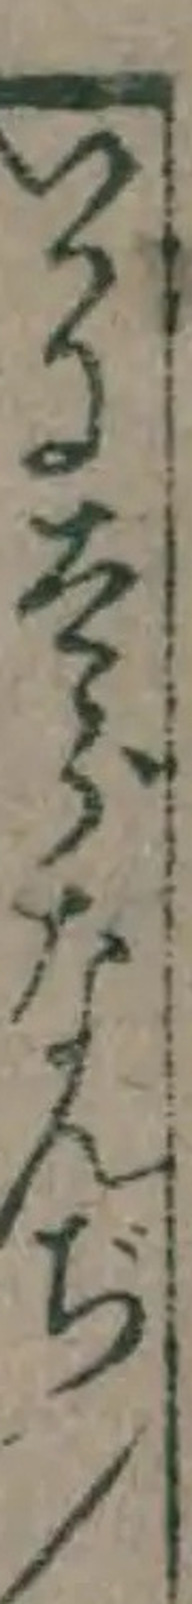いかに太郎なんぢ
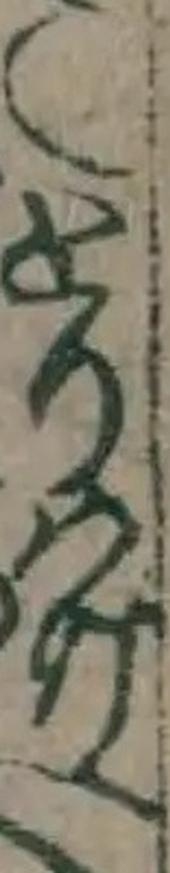とりはけ
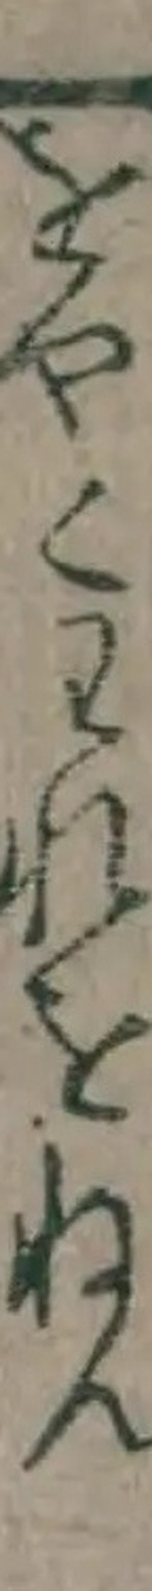をやくわれをねん
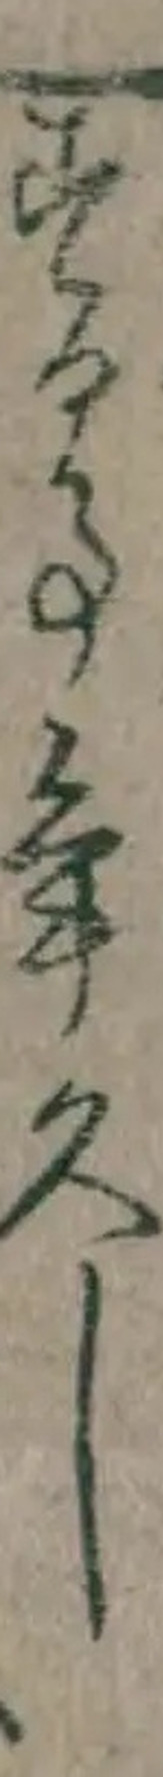する事年久し
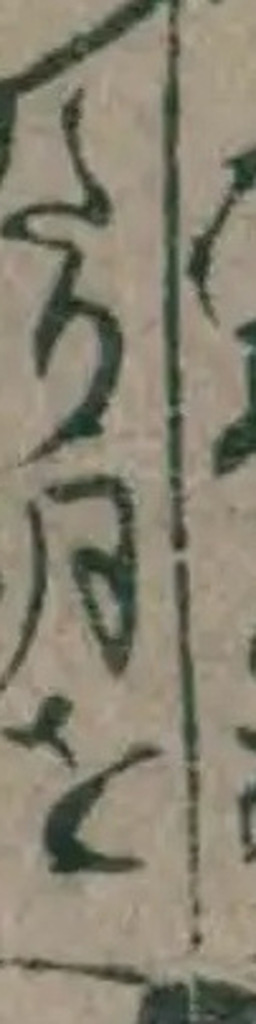たり月を
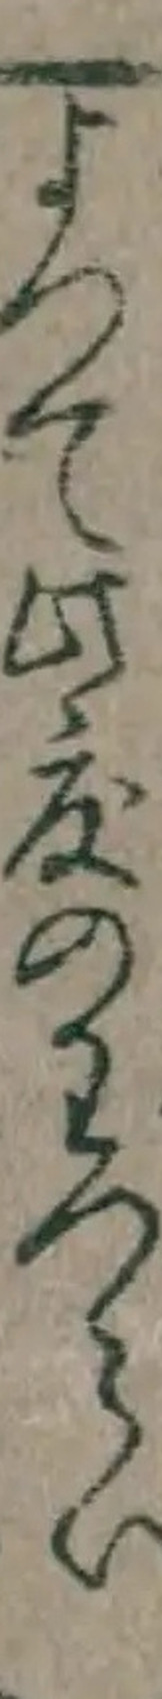よつて此度のわつらい
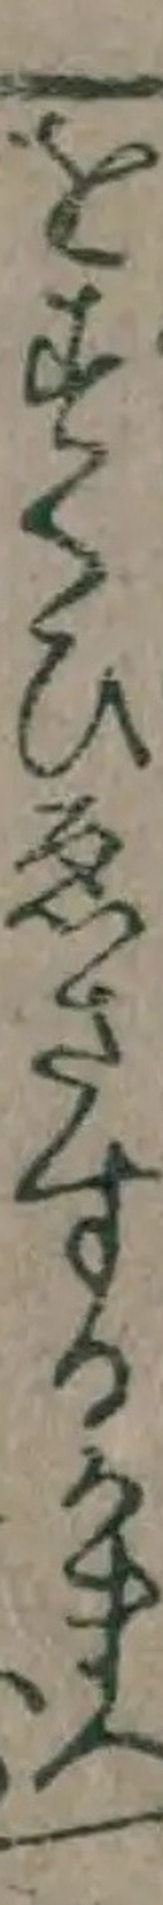をすくひゑさするかまへ
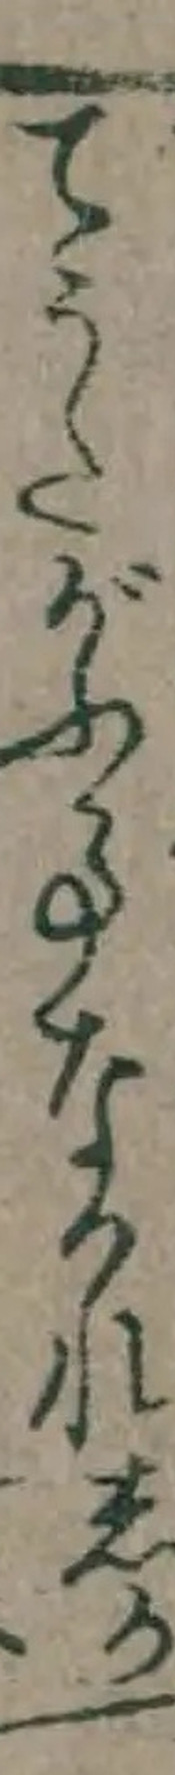てうたがふ事なかれしか
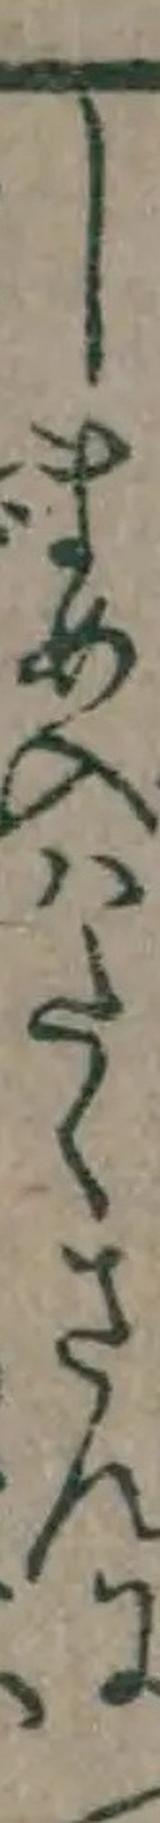しまめ入はたくさんに
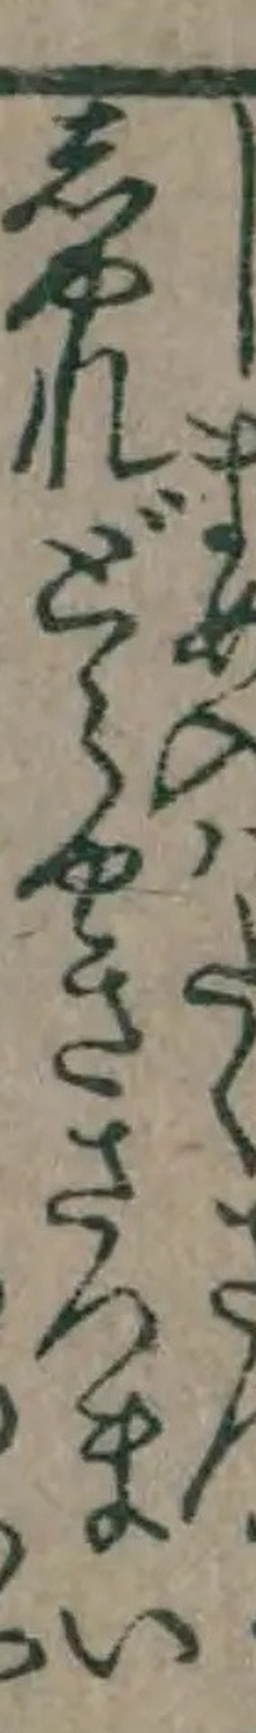しやれどらやきさつまい
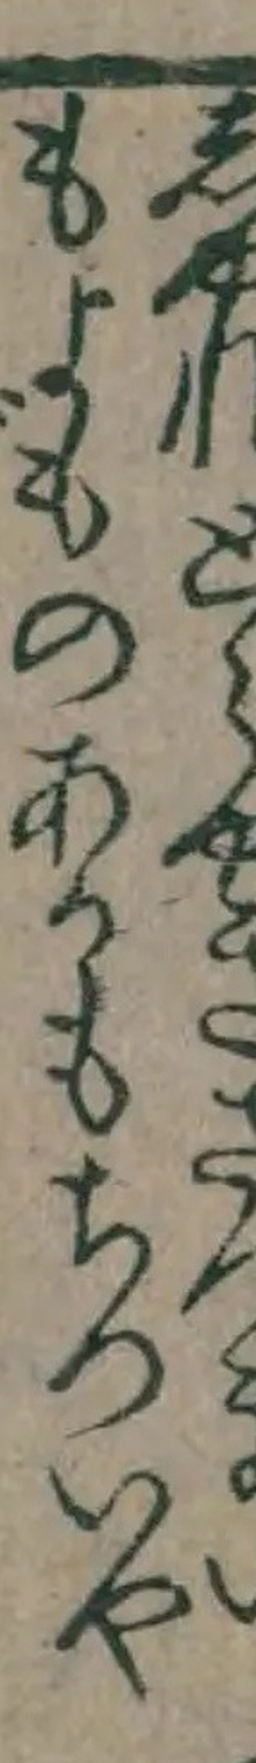もよものあかもちついや
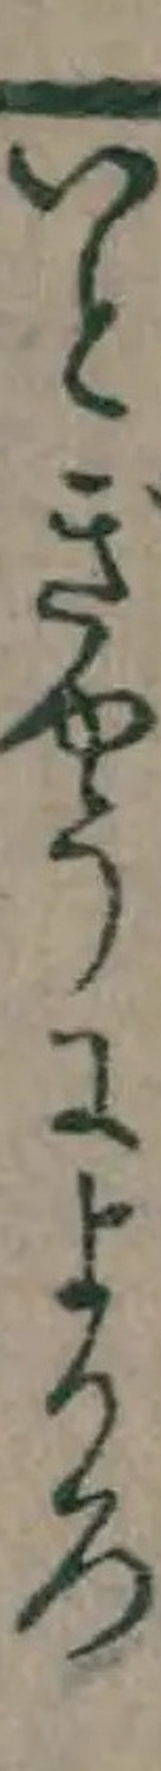いとぎやうによかろ
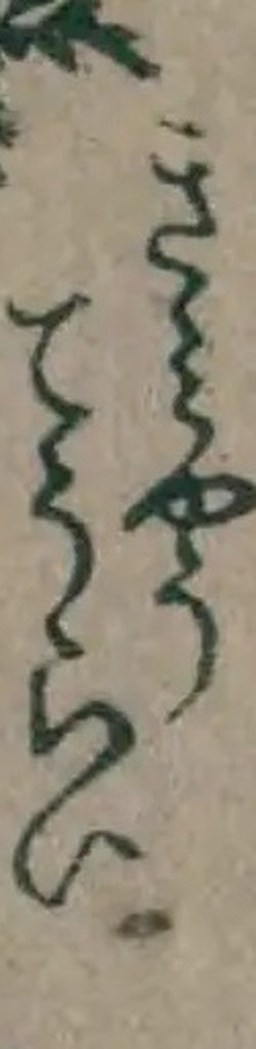てうらい
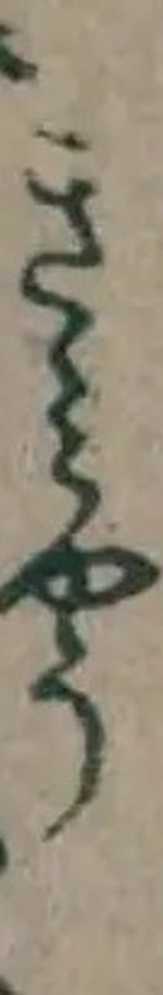きみやう
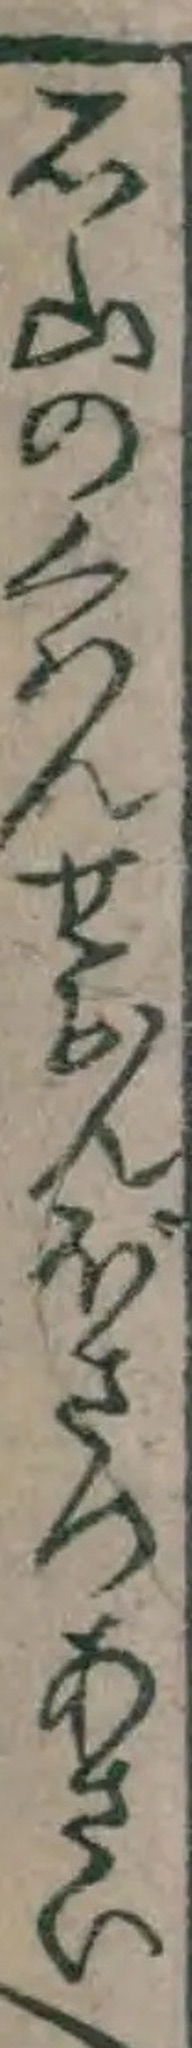石山のくはんせおんぼさつあさい
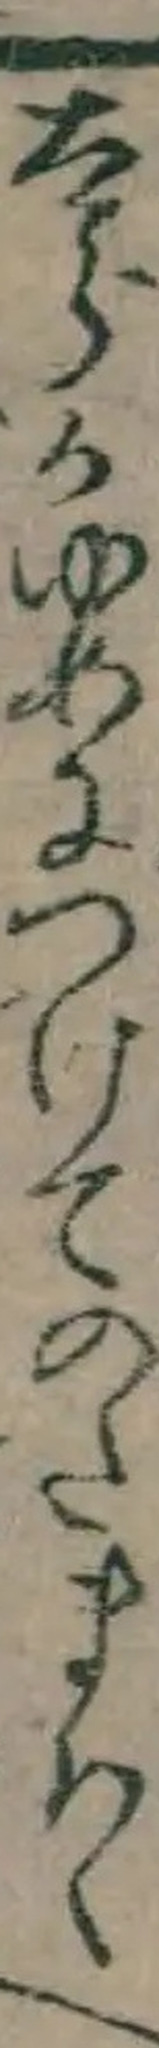太郎かゆめにつけてのたまはく
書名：団十郎蓬芥伝
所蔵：国立国会図書館 National Diet Library, JAPAN
